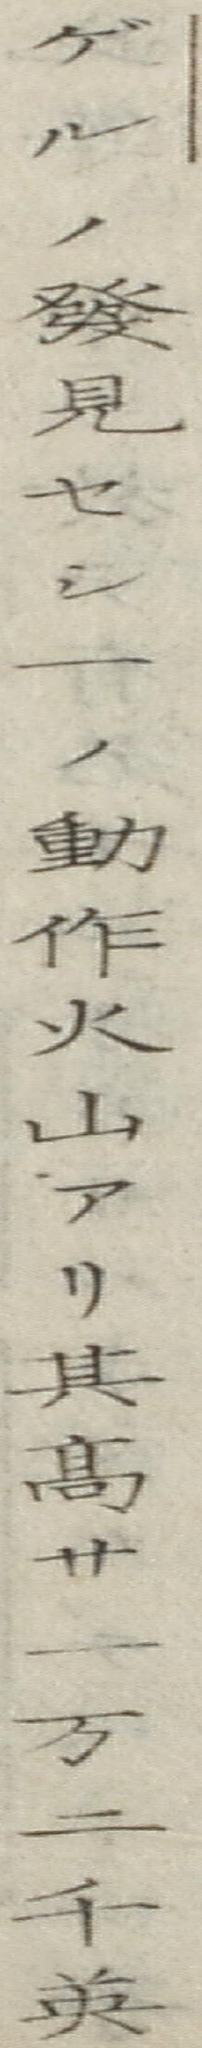ゲルノ発見セシ、一ノ動作火山アリ其高サ一万二千英
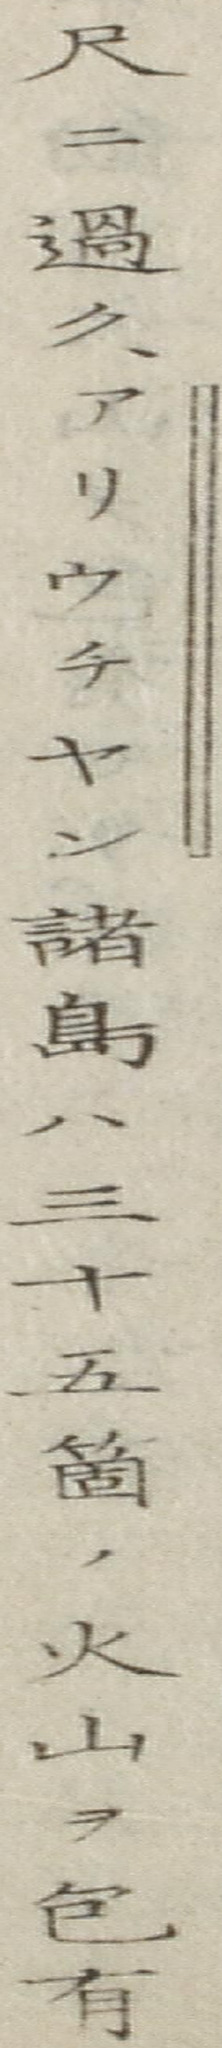尺に過ク、アリウチヤン諸島ハ三十五箇ノ火山ヲ包有
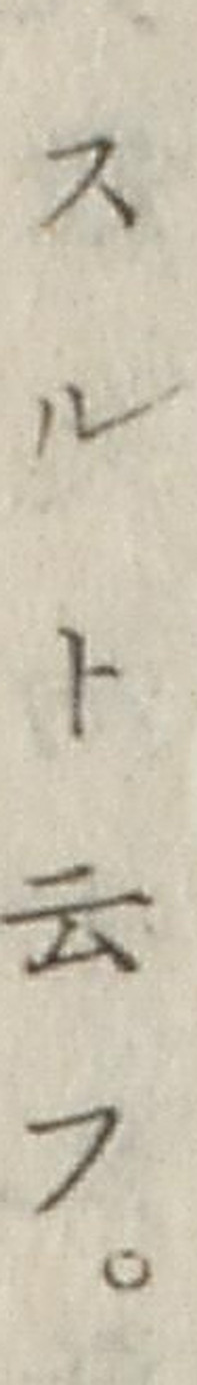スルト云フ。
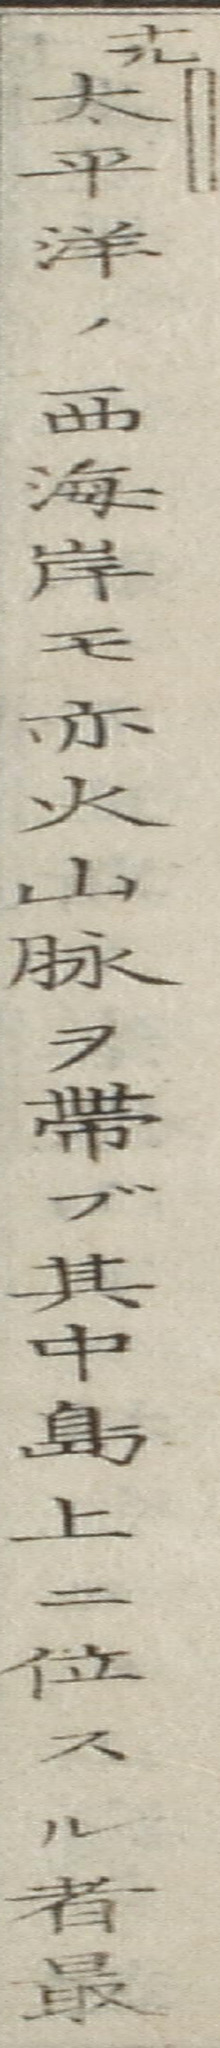一九太平洋ノ西海岸モ亦火山脈ヲ帯ブ其中島上ニ位スル者最
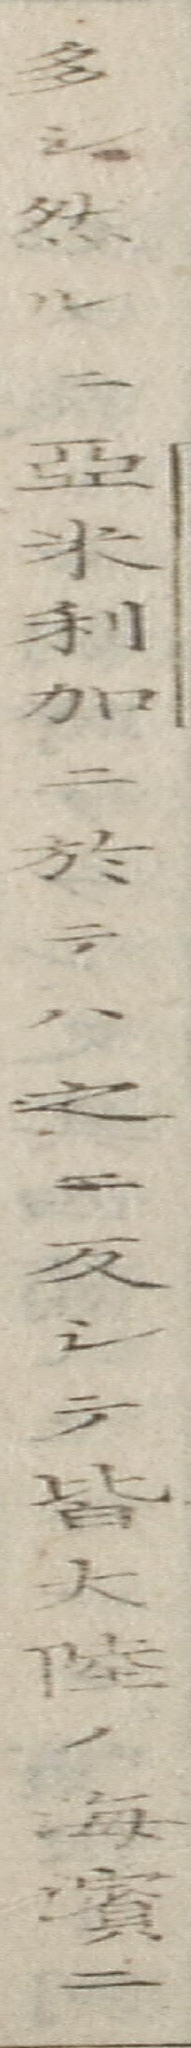多シ然ルニ亜米利加ニ於テハ之ニ反シテ皆大陸ノ海濱ニ
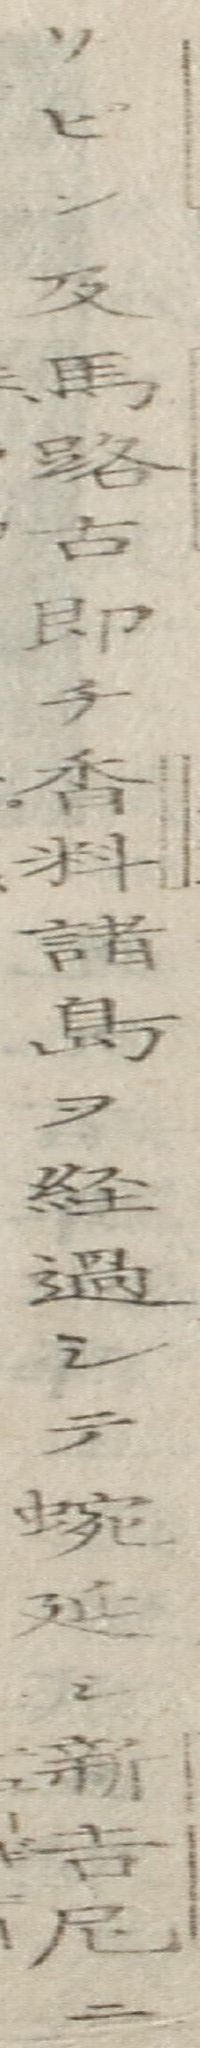リピン及馬路古即チ香料諸島ヲ経過シテ蜿延シ新吉尼ニ
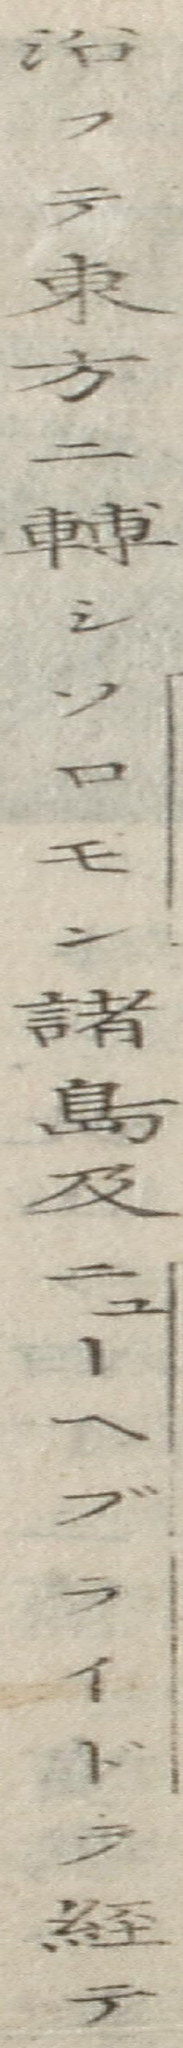沿フテ東方ニ転シソロモン諸島及ニューヘブライドヲ経テ
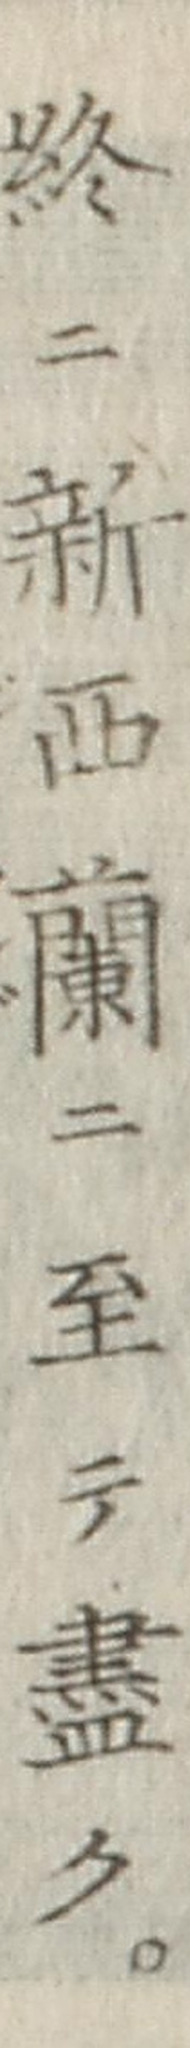終ニ新西蘭ニ至テ尽ク。
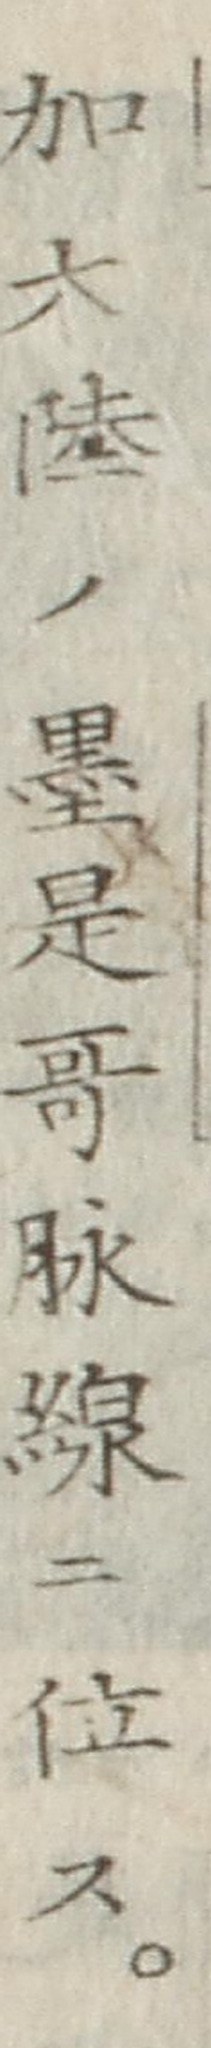加大陸ノ墨是哥脈線ニ位ス。
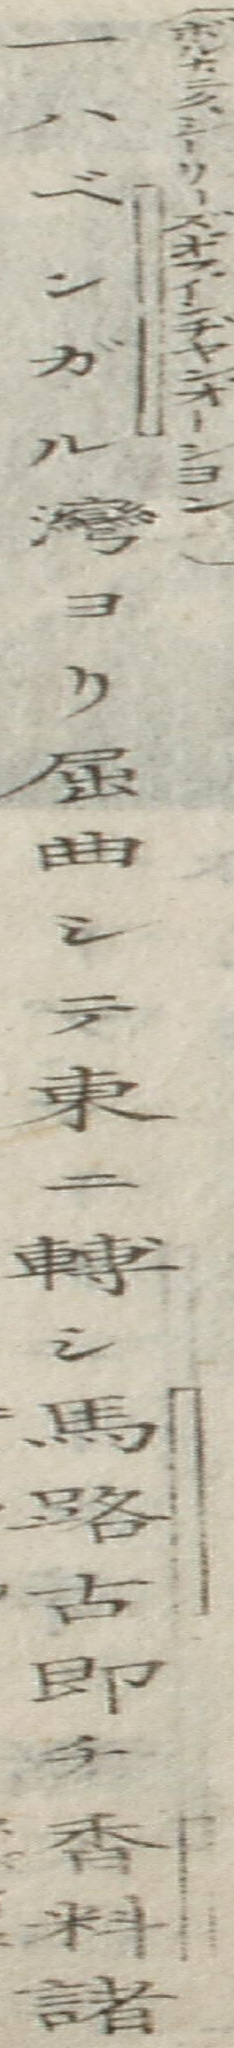一ハベンガル湾ヨリ屈曲シテ東ニ転シ馬路古即チ香料諸
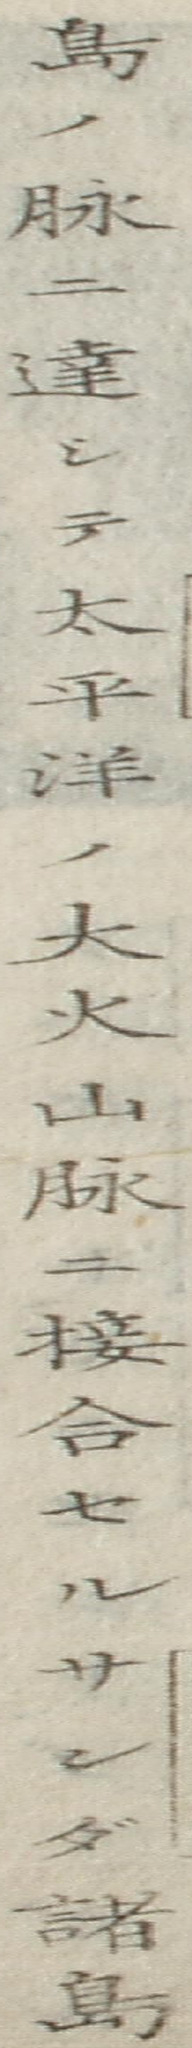島ノ脈ニ達シテ太平洋ノ大火山脈ニ接合セルサンダ諸島
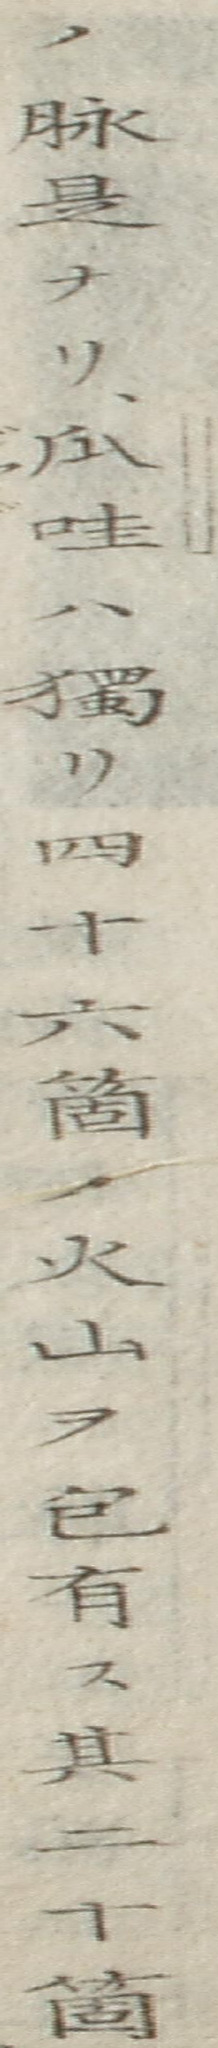ノ脈是ナリ、瓜哇ハ独リ四十六箇ノ火山ヲ包有ス其二十箇
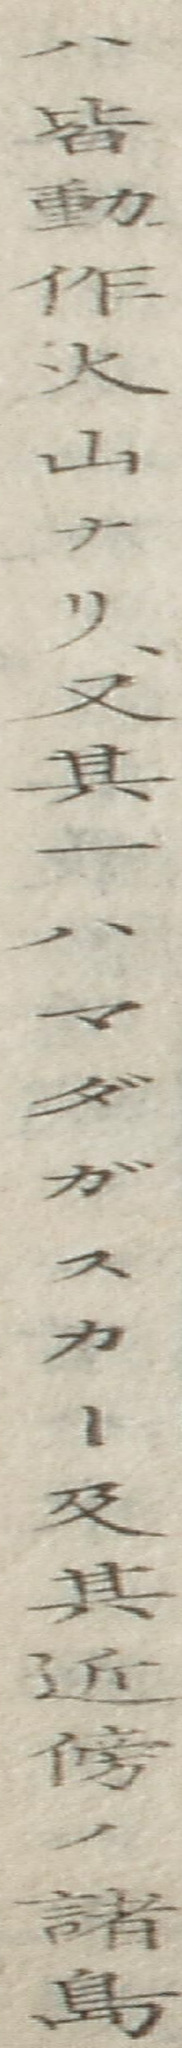ハ皆動作火山ナリ、又其一ハマダガスカー及其近傍ノ諸島
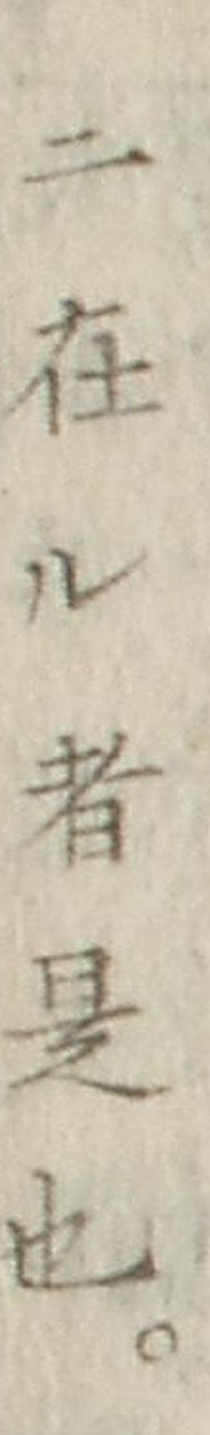ニ在ル者是也。

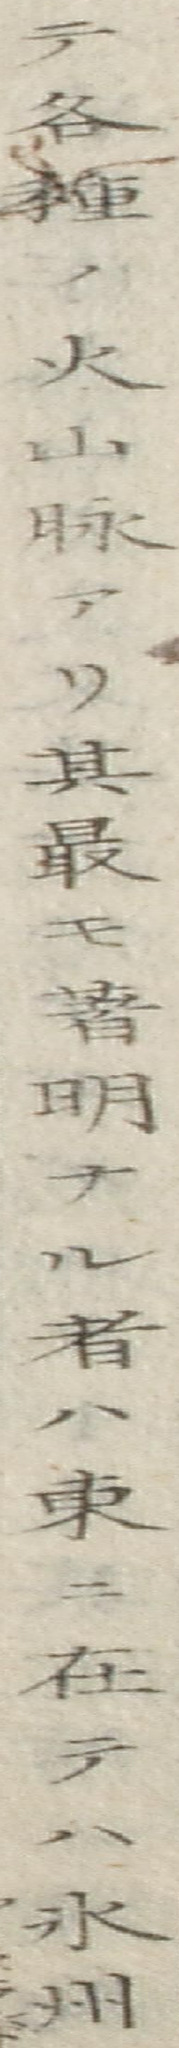テ各種ノ火山脉アリ其最モ著明ナル者ハ東ニ在テハ氷州
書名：地形論　巻二
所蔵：東京大学地震研究所図書室 Earthquake Research Institute Library, The University of Tokyo, JAPAN
